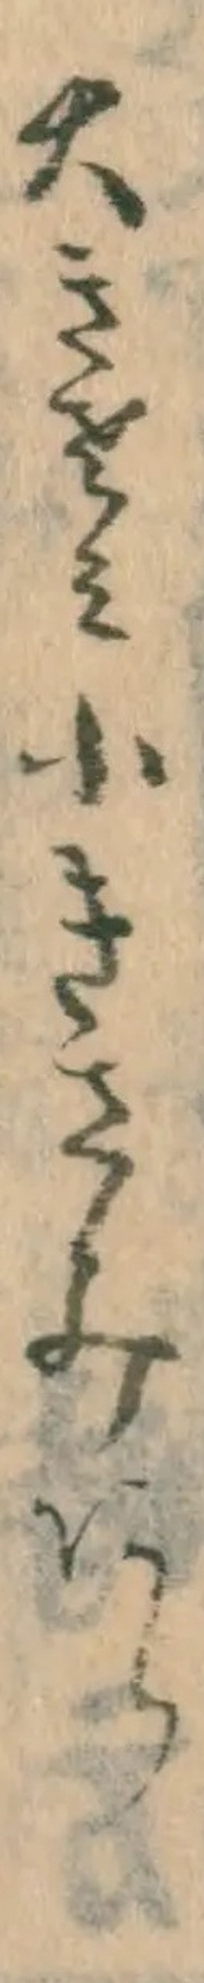大きさみ小きさみあり
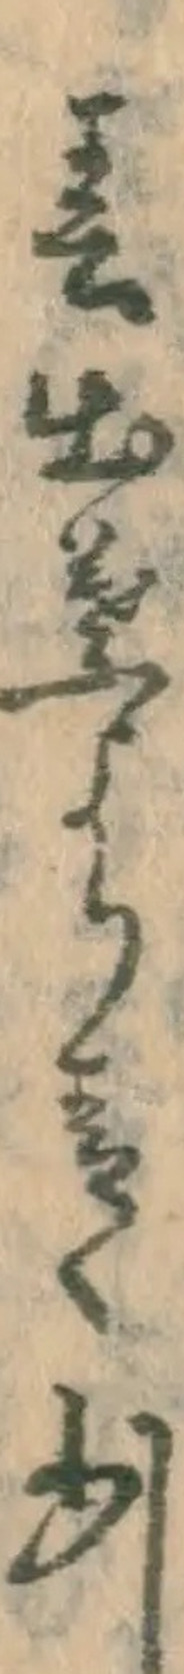春出葉より青く少し
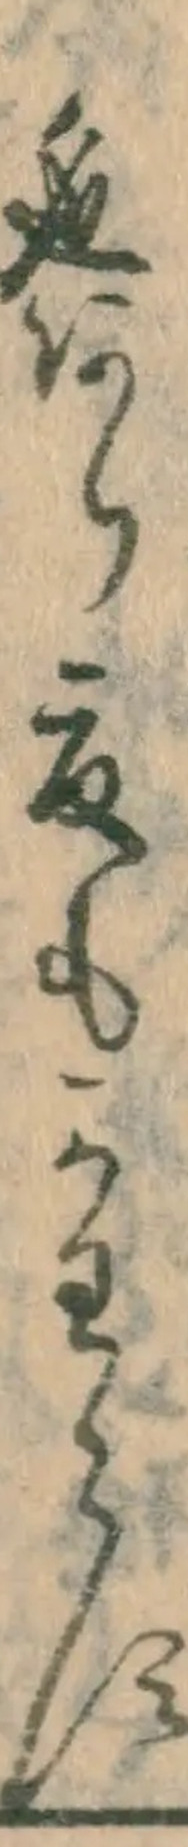色あり夏もかわらす
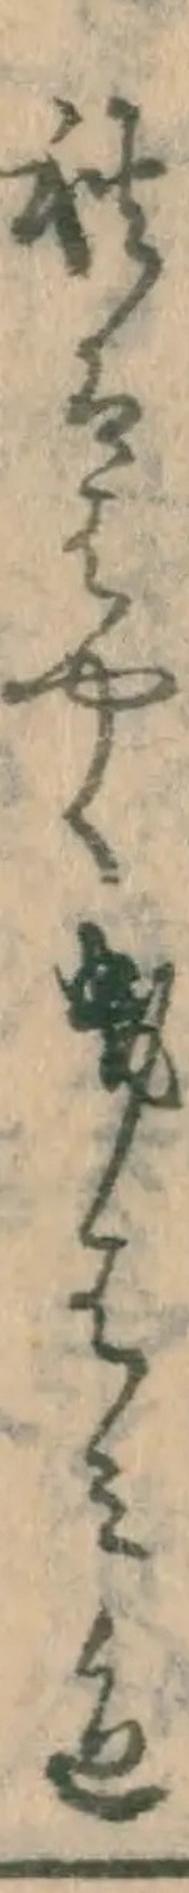秋ははやくきはみ色
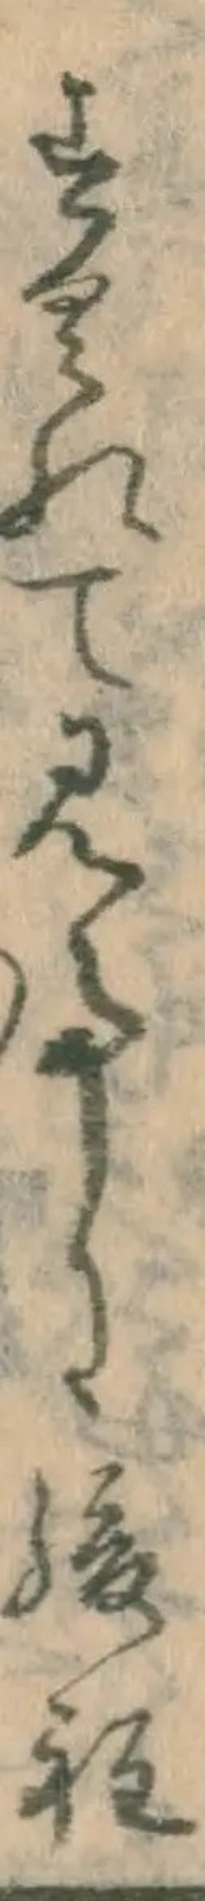すくれて見事に後程
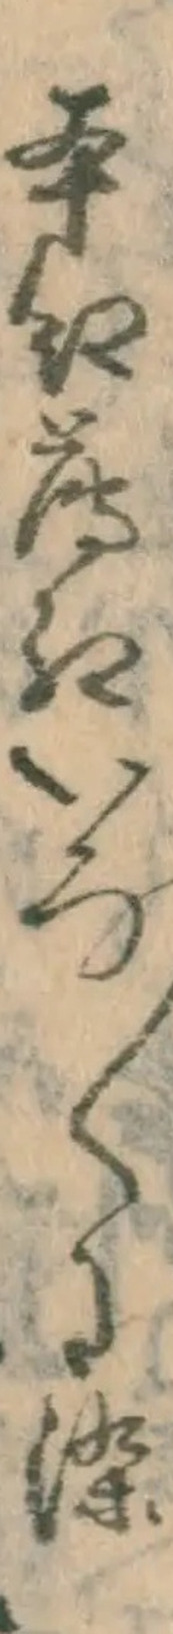本紅薄紅いろ〳〵に染
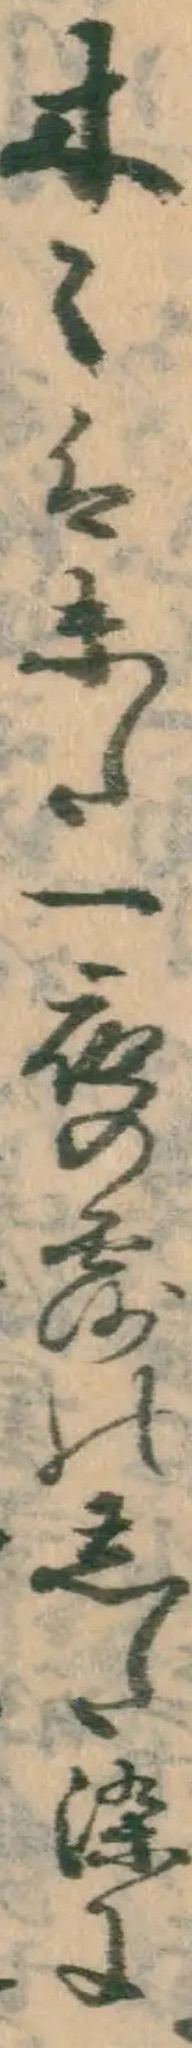木々は未た一夜の露のした染に
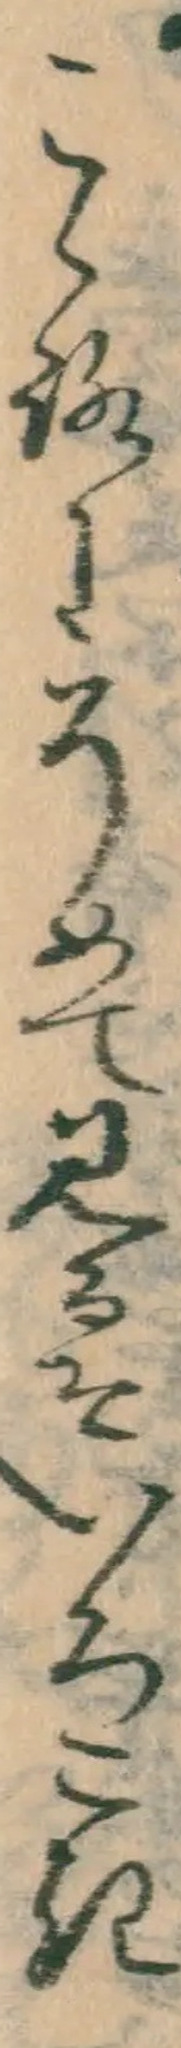こゝろにそめて見るそいろこき
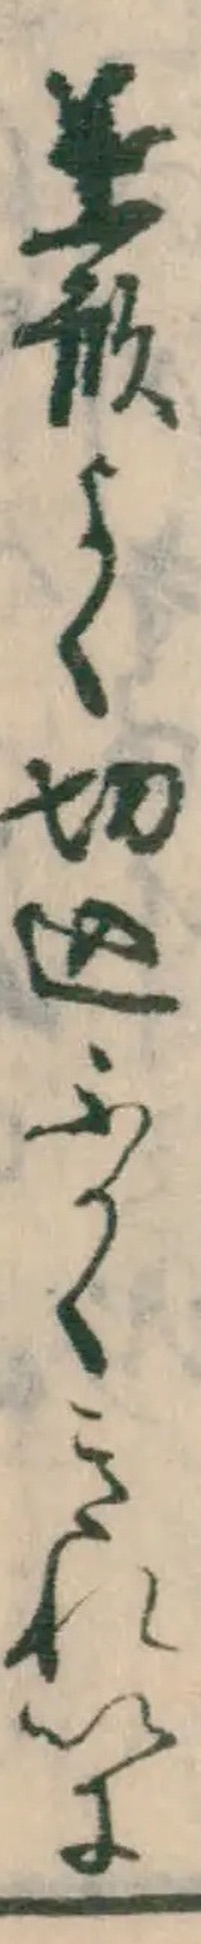清滝葉形よく切込ふかくきれいに
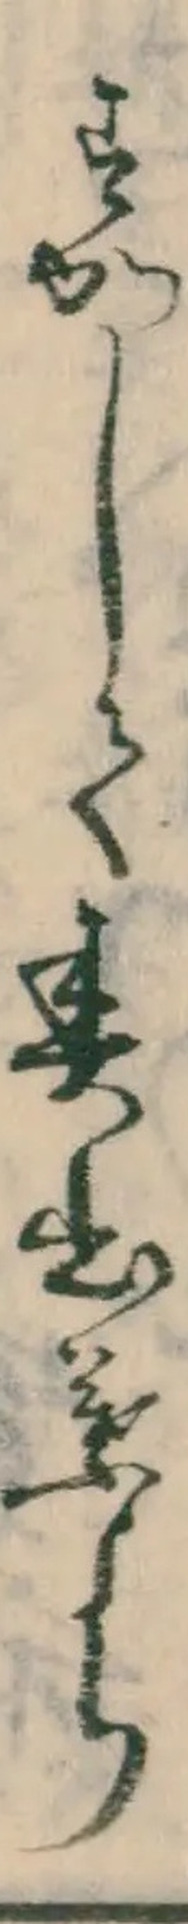すかして春出葉より
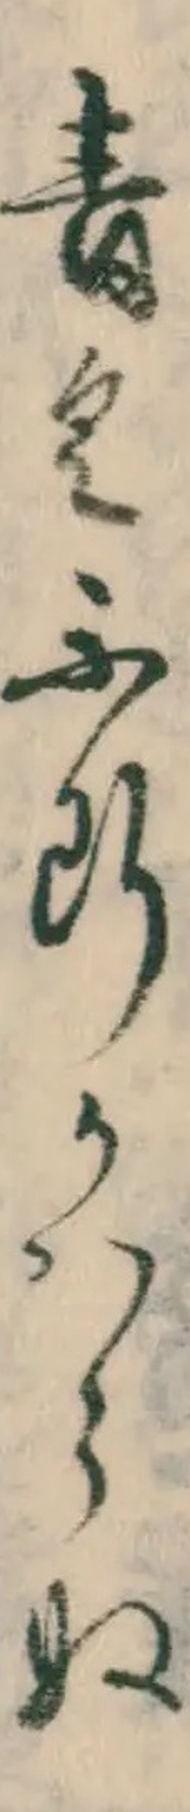青く不断かはらぬ
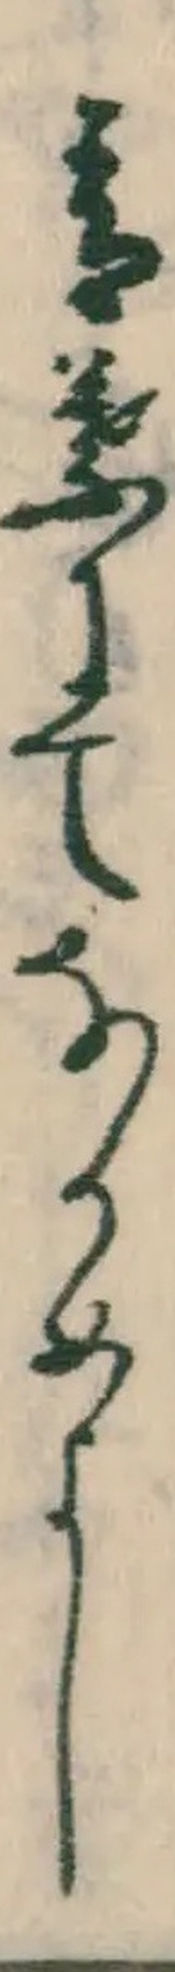青葉にてなかめよし
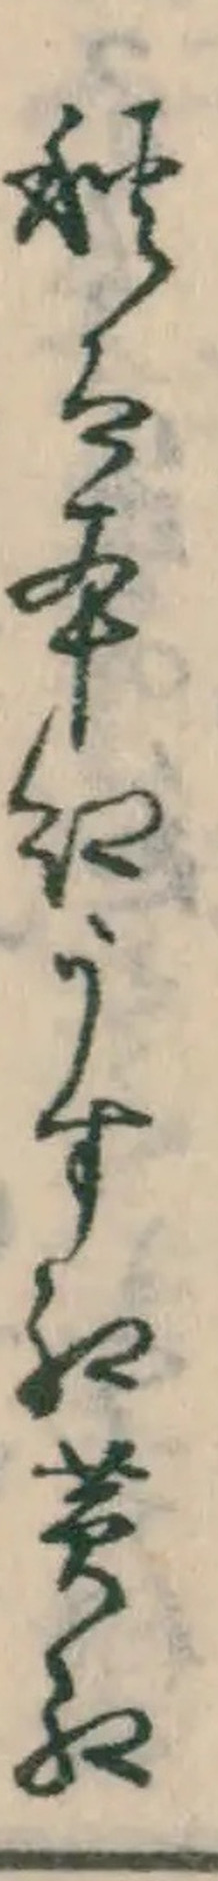秋は本紅うす紅黄紅
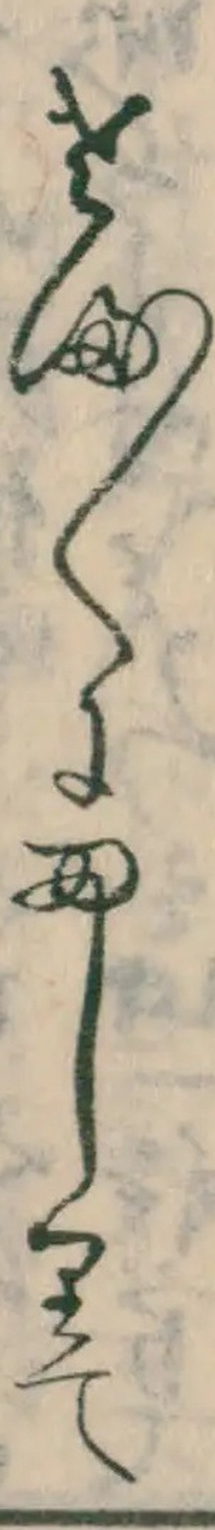さま〳〵にましりて
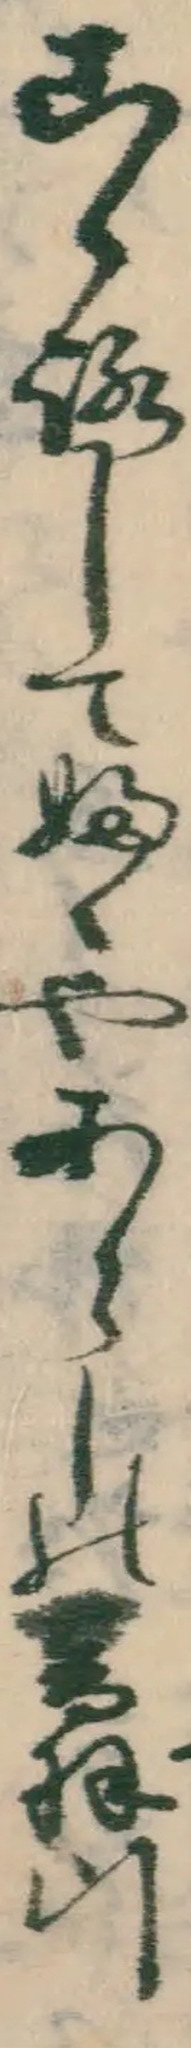こころしてふくやあらしの音羽川
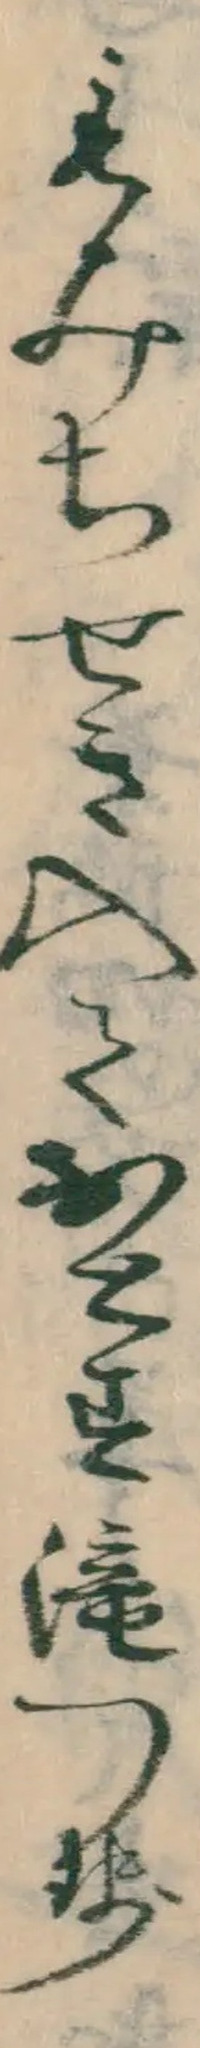もみちせき入ておとす滝つせ
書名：紅葉集
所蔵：国立国会図書館 National Diet Library, JAPAN
